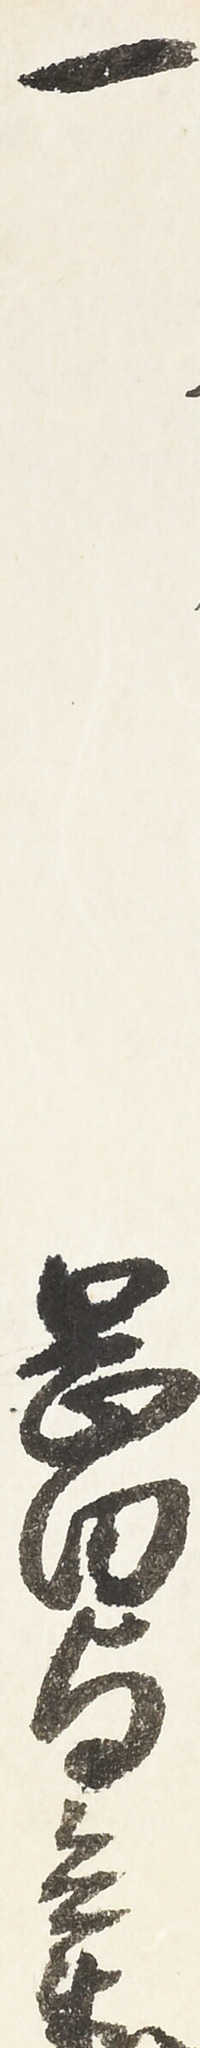一岡田与兵衛・
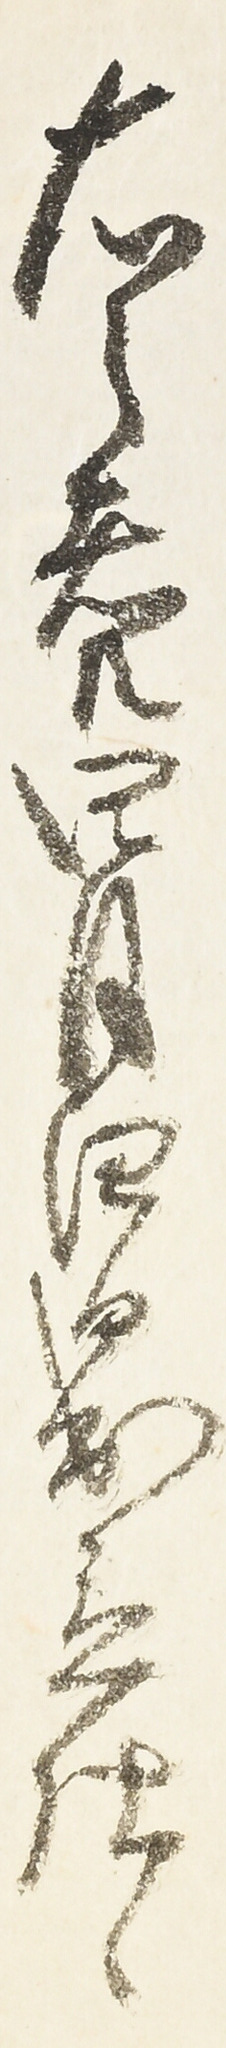右之者共四月四日出立仕候
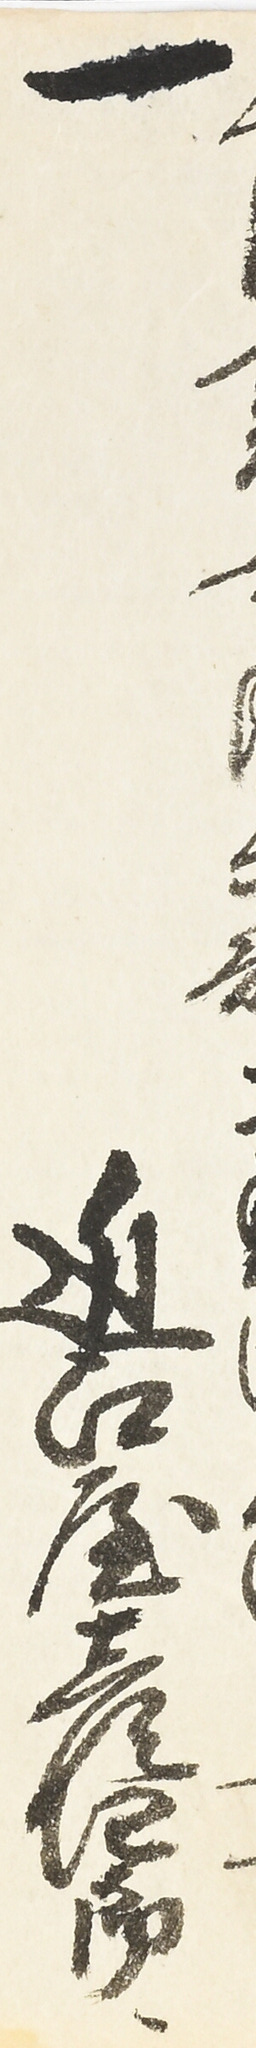一近江屋彦四郎・
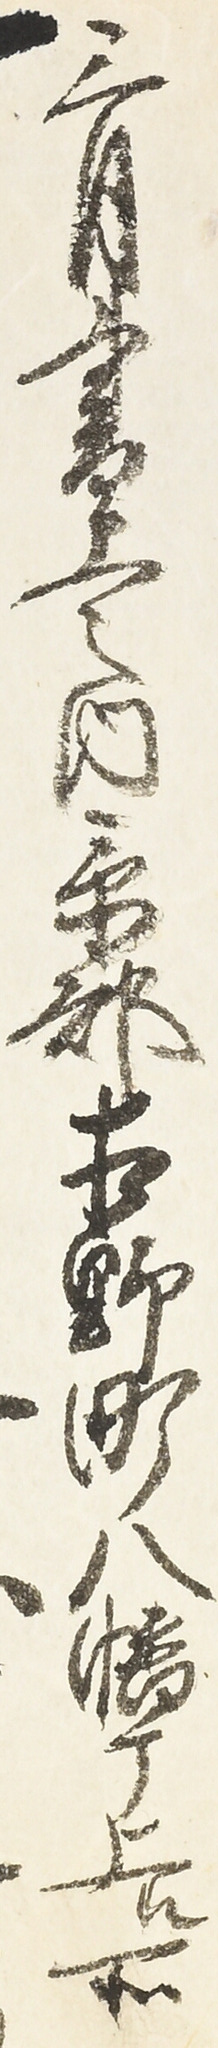三月書上之内京都相野町八幡丁上ル所
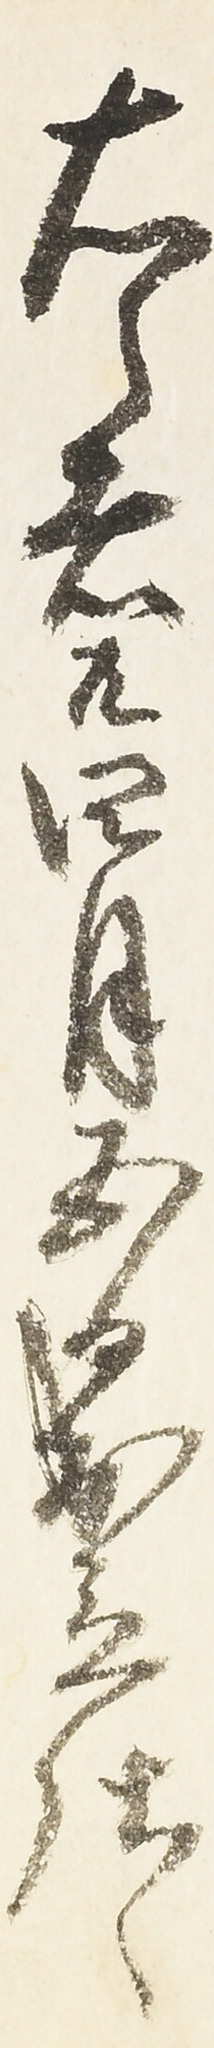右之者共四月五日出立仕候
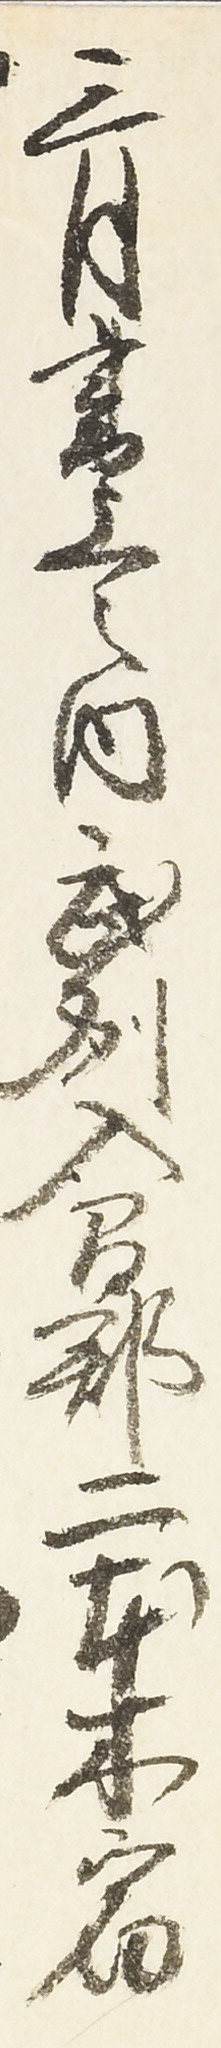三月書上之内武州入間郡二本木宿
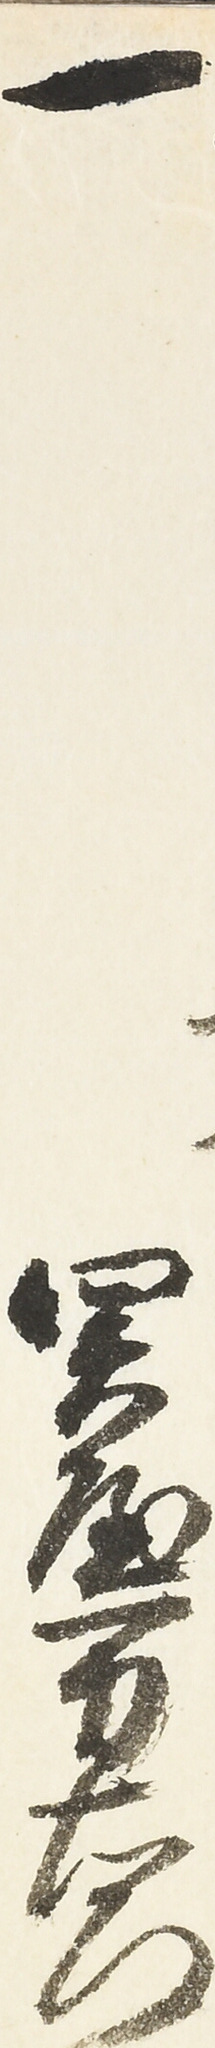一関屋万右衛門・
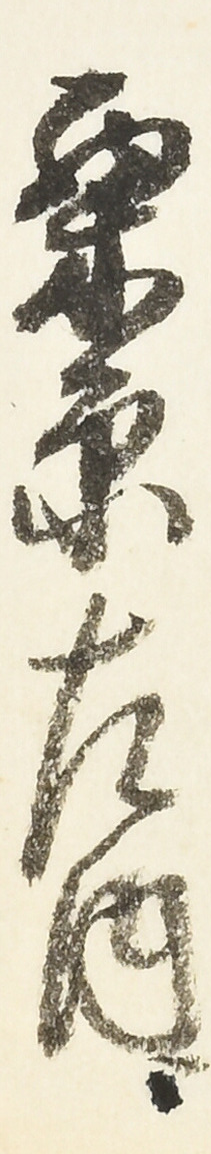栗原左内・
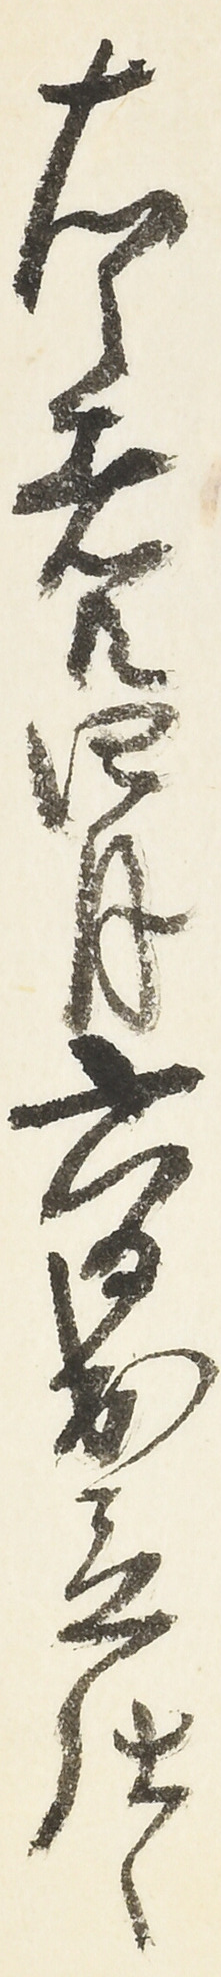右之者共四月六日出立仕候
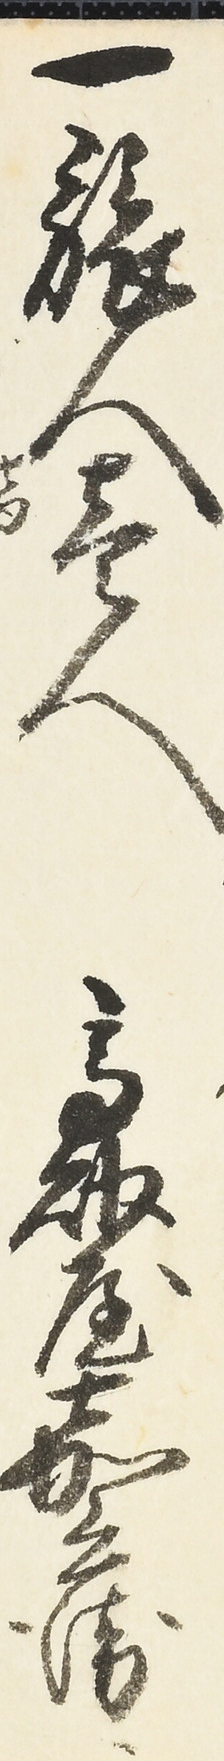一旅人壱人高砂屋嘉兵衛・
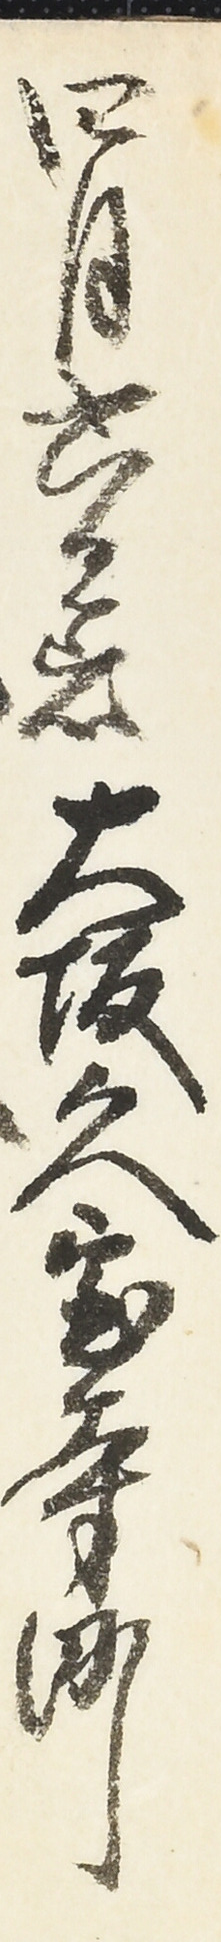四月六日着大坂久宝寺町
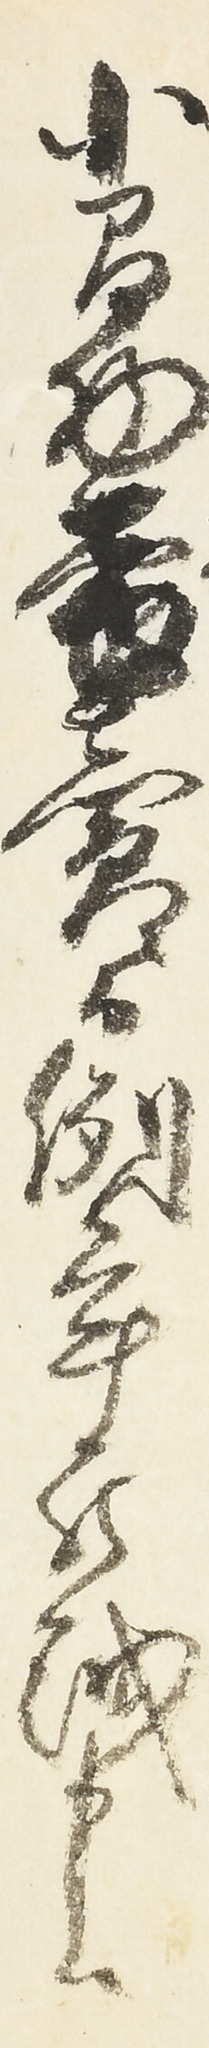小間物商売ニ而例年罷越申候
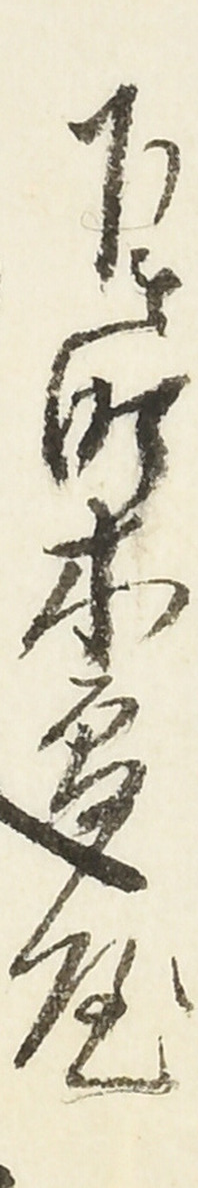下モ町木曽屋
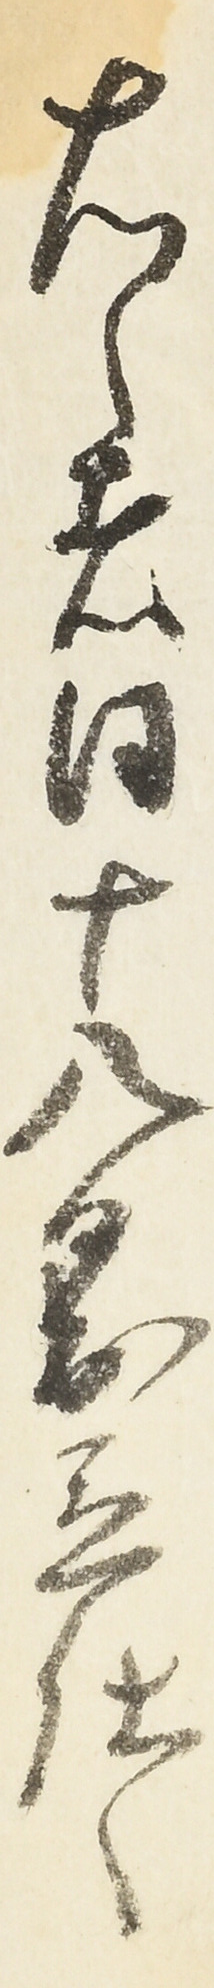右之者同十八日出立仕候
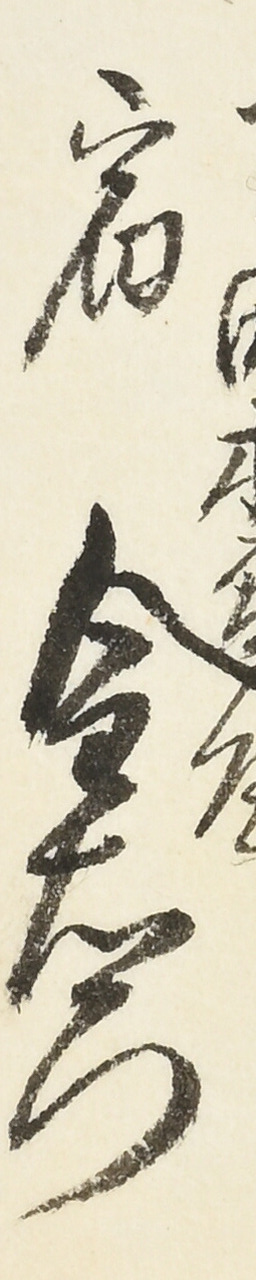宿金右衛門

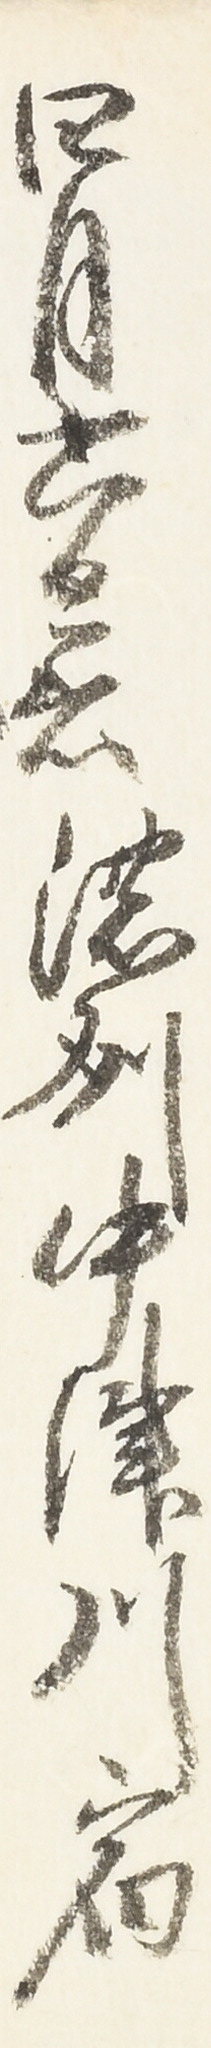四月六日着濃州中津川宿
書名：町中旅人泊控帳
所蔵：伊那市立高遠町図書館・合同会社AMANE
